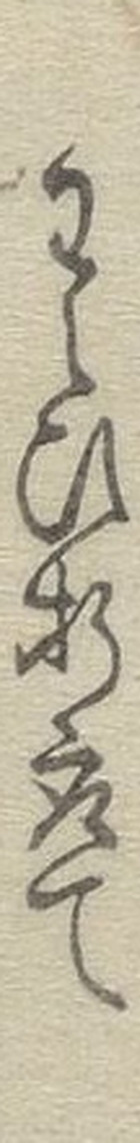わらひ折取て
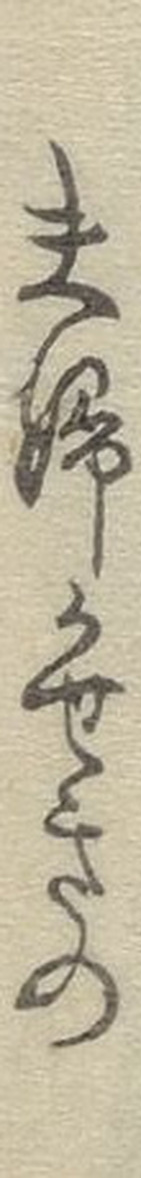夫婦かせきの
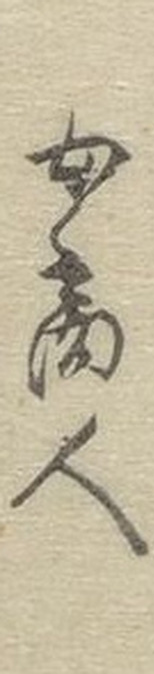女商人
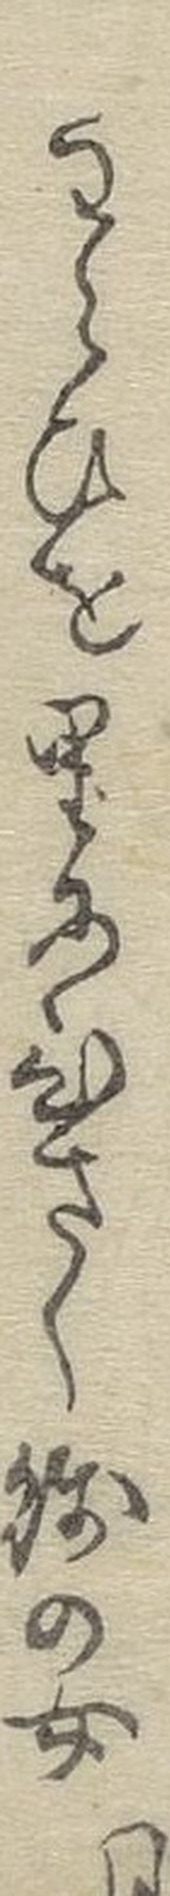わらひを里にひさく賤の女月守

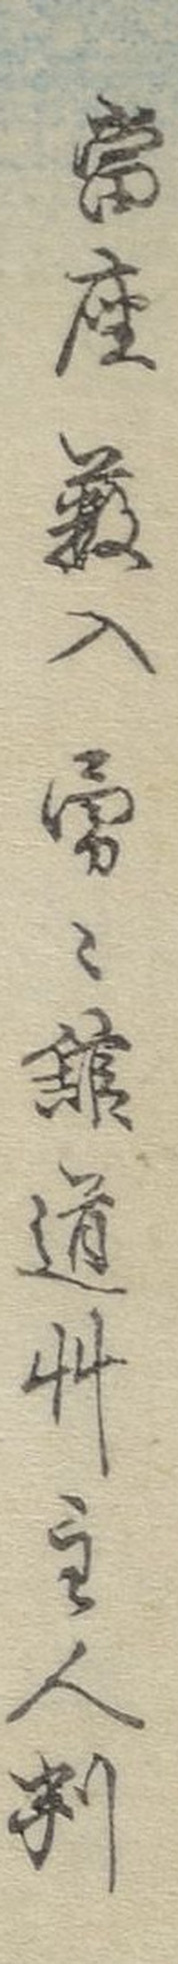当座藪入勇々館道草主人判
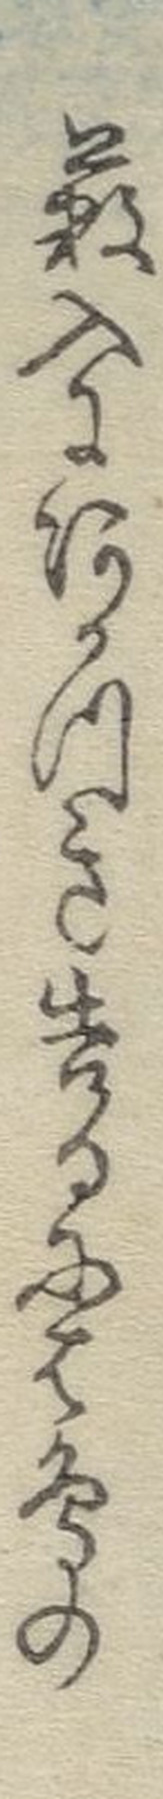藪入にあかつき告るには鳥の
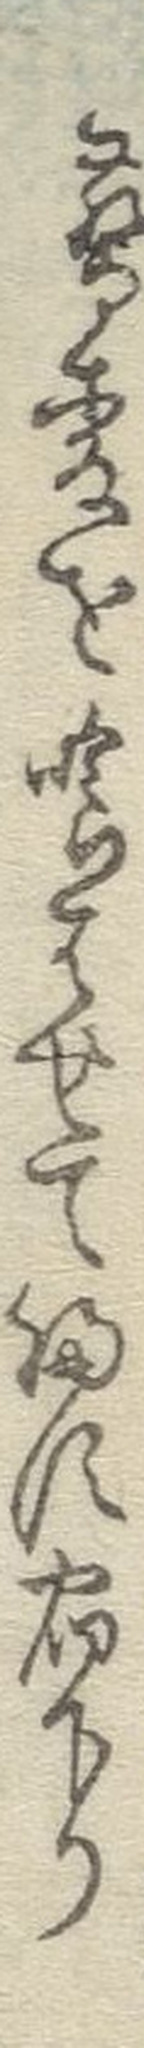蕎麦を喰はせて帰す宿下り夜宴
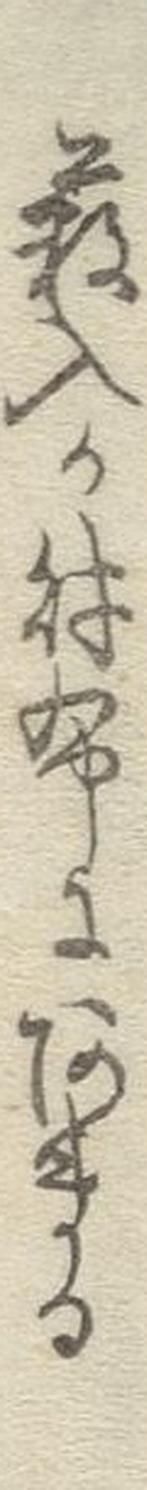藪入か財布にあまる
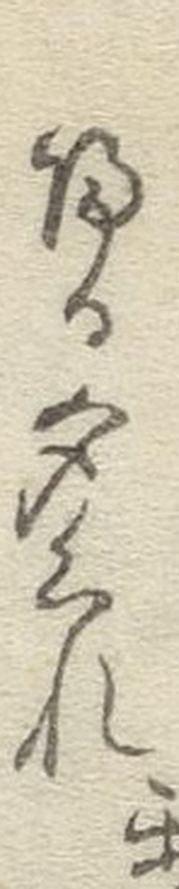帰る夕くれ琴樽
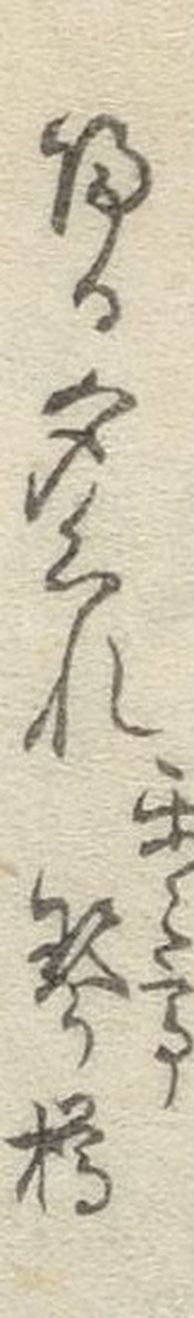帰る夕くれ琴樽
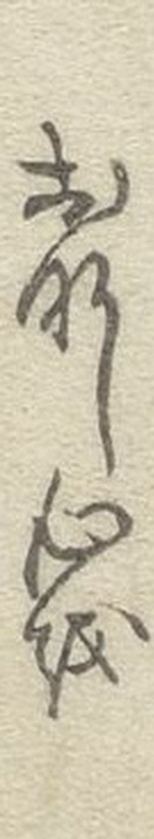おなし心を
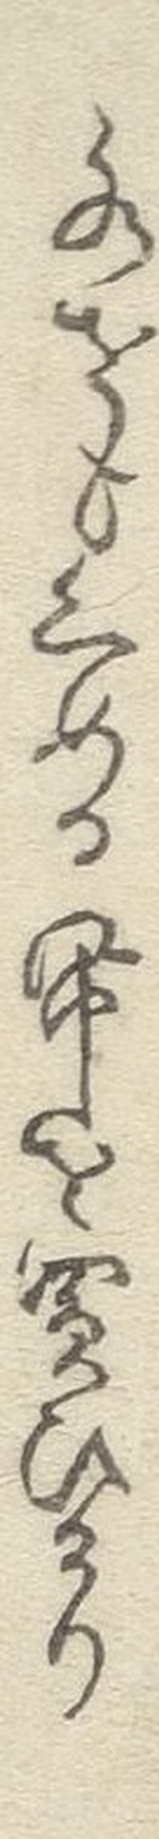水をもくめる凧を買ひけり
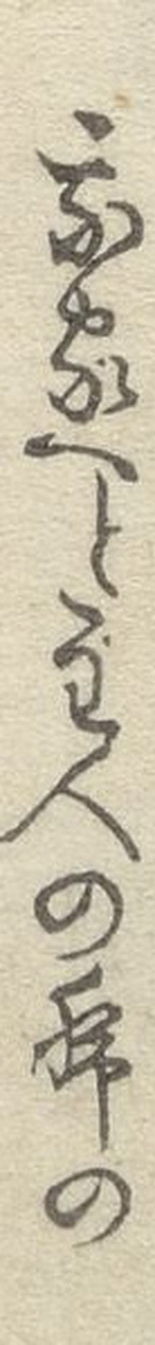我家へと主人の虎の
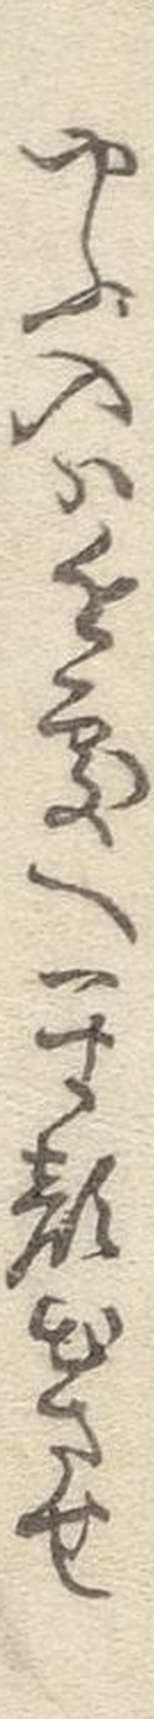やふ入は近処へ一寸顔出させ
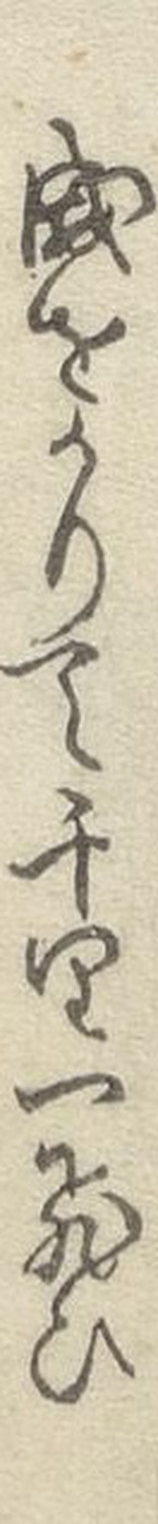威をかりて千里一飛ひ
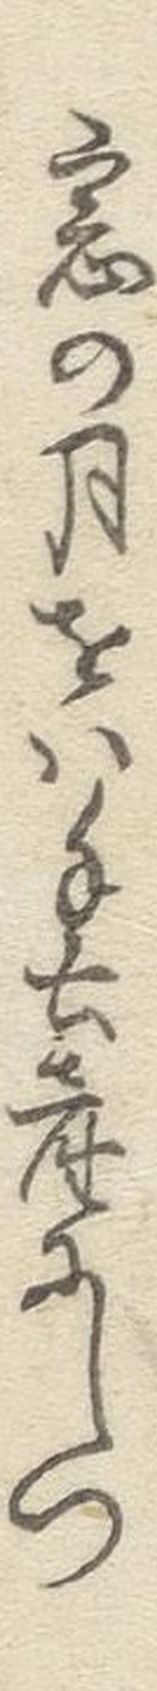窓の月をは手土産にしつ
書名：Picture Album of People with Kyōka (Light Verse) (Kyōka shiki jinbutsu 狂歌四季人物)
